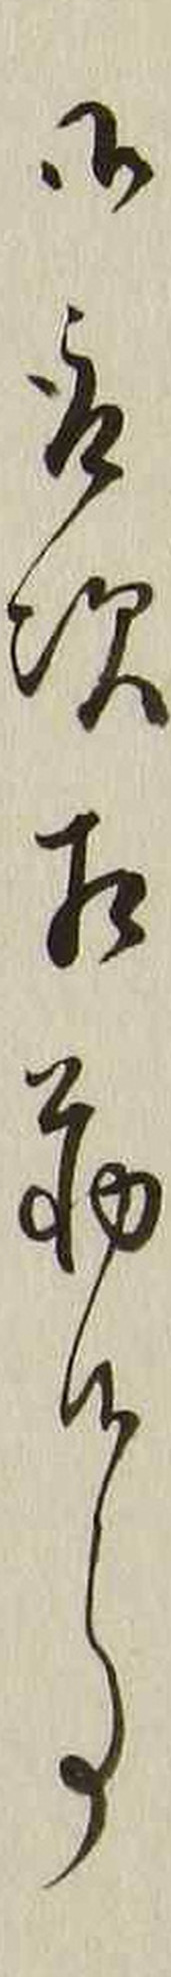御取次相勤候事
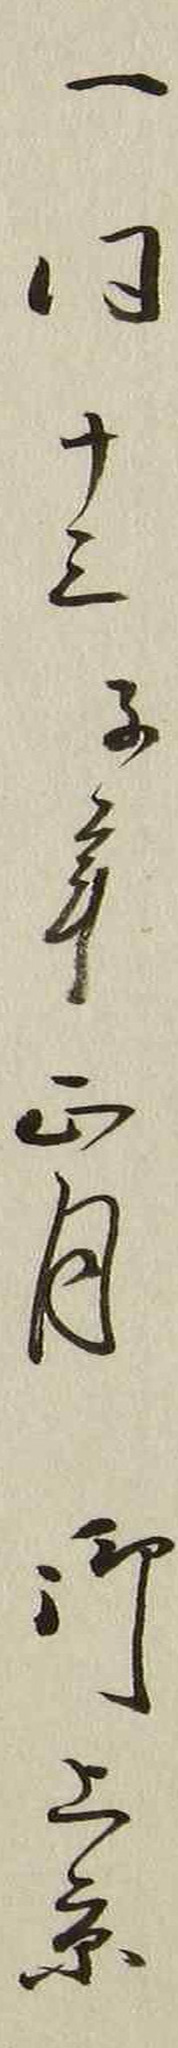一同十三子年正月御上京
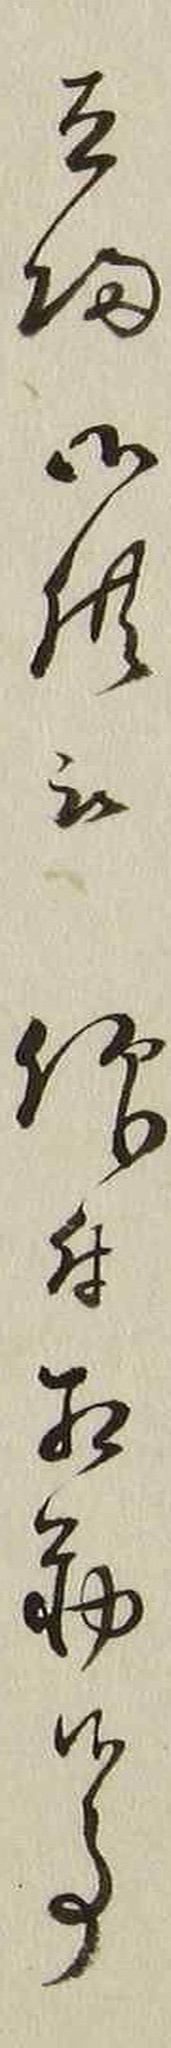立帰御供被仰付相勤候事
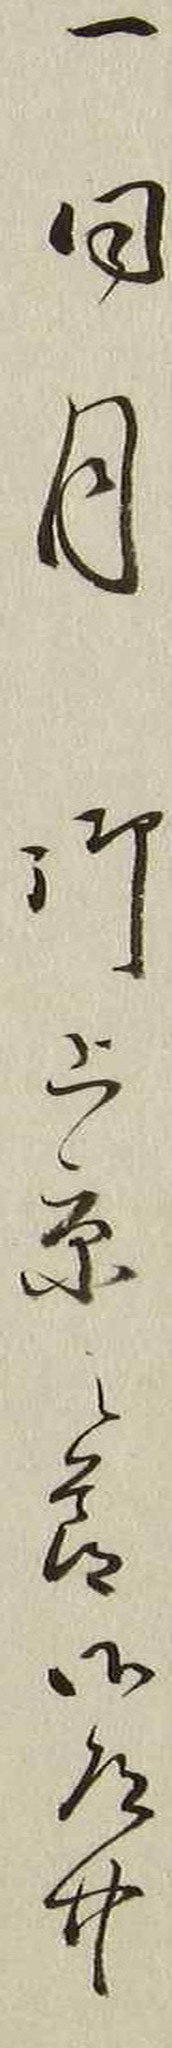一同月御上京之節御道中
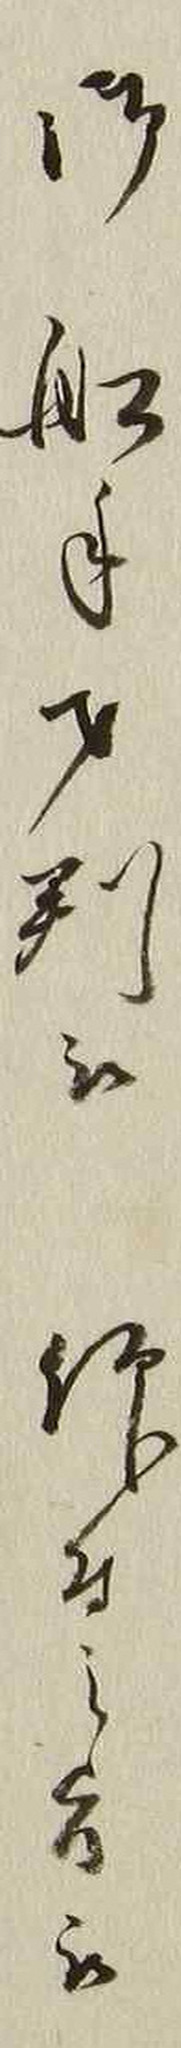御船手才判被仰付之旨被
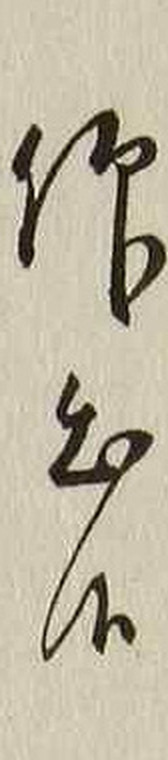仰出候
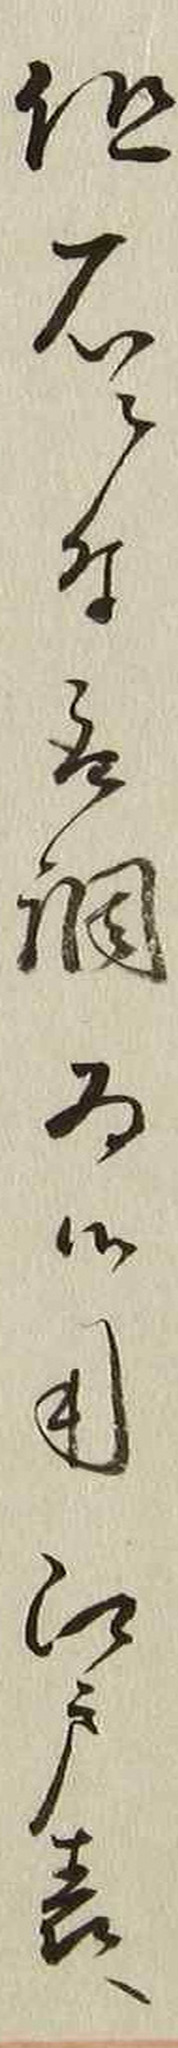但右に付取調為御用江戸表へ
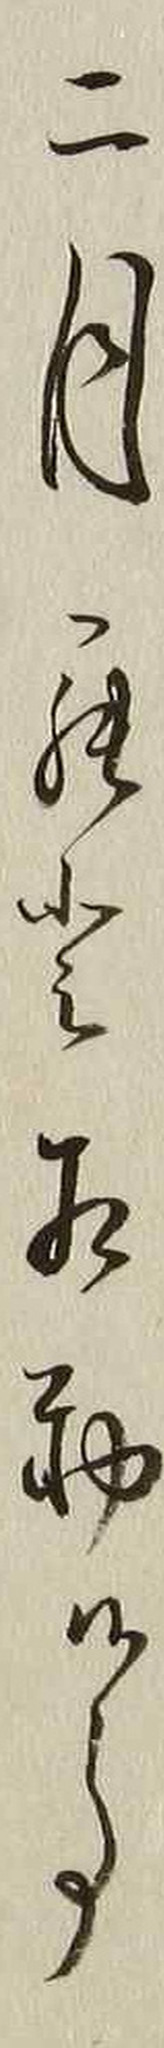二月罷登相勤候事
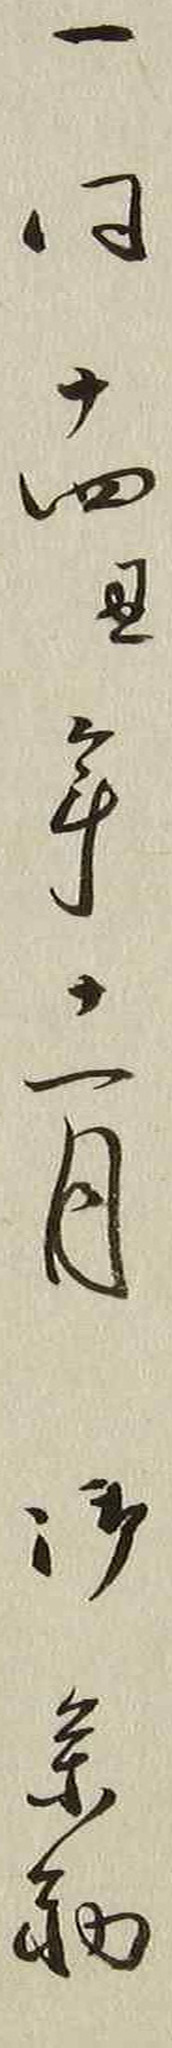一同十四丑年十一月御参勤
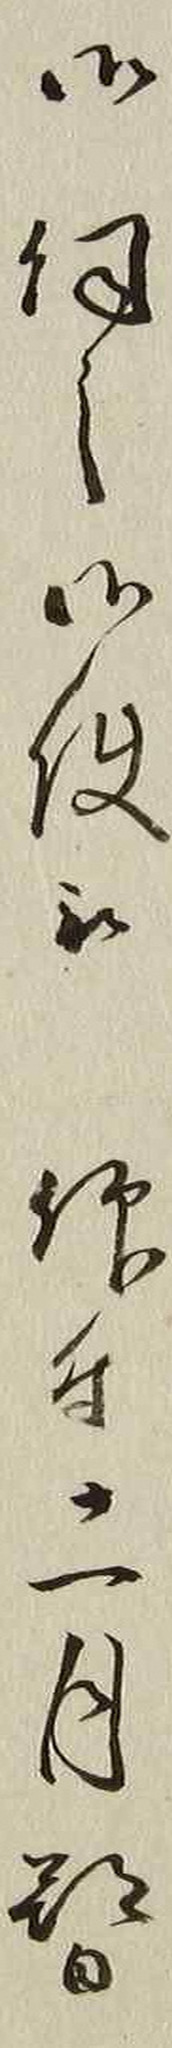御伺之御使被仰付十一月朔日
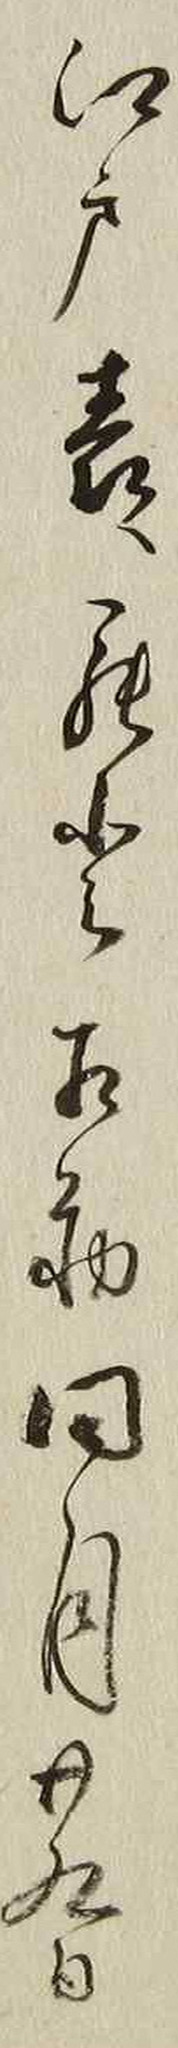江戸表へ罷登相勤同月廿九日
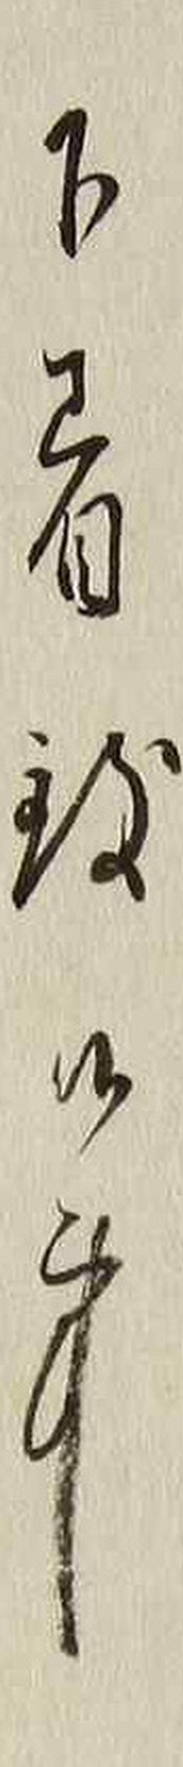下着致候事
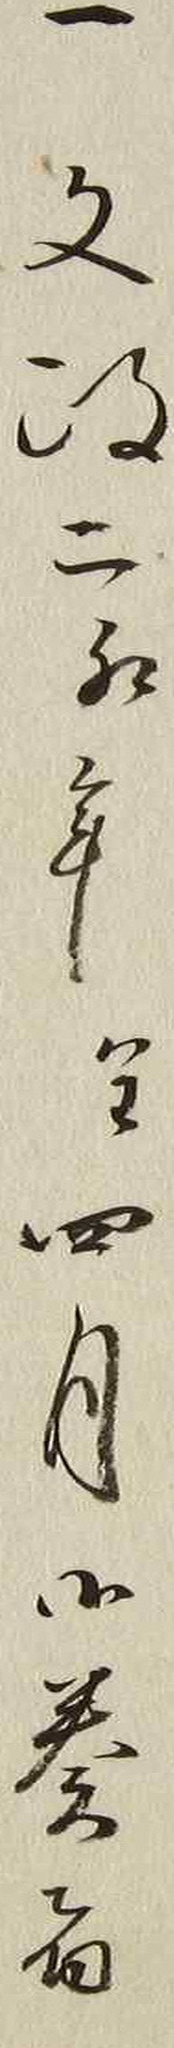一文政二卯年閏四月御奏者
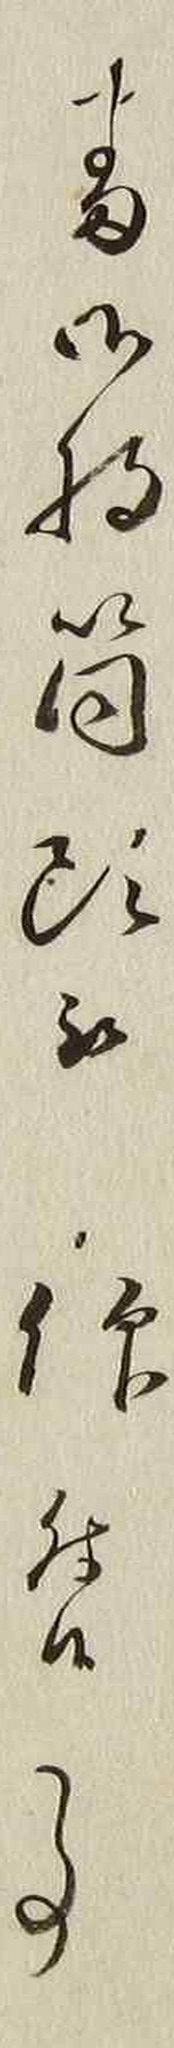番御持筒頭被仰付候事
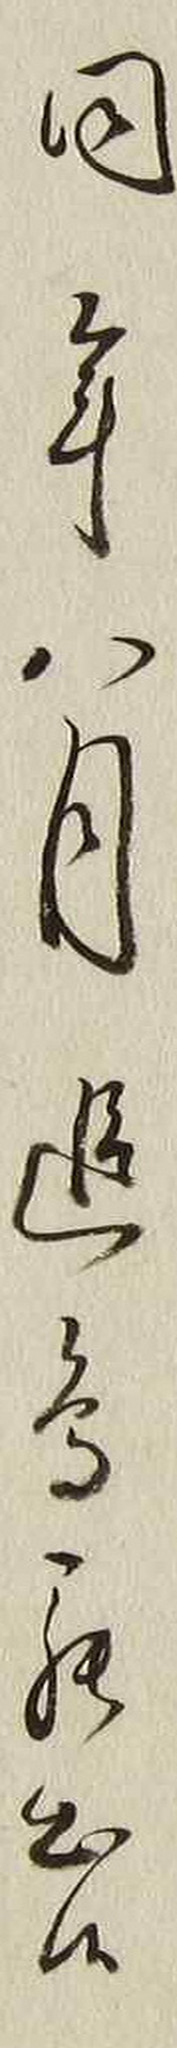一同年八月追鳥罷出候
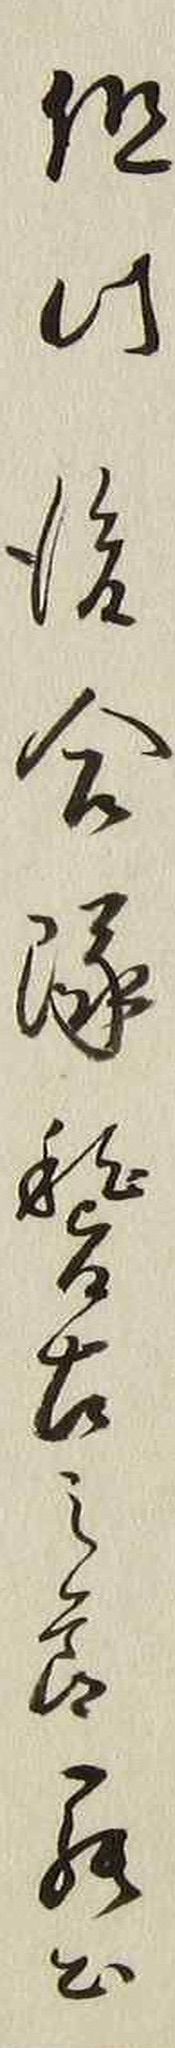但此後合隊稽古之節罷出
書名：諸士系譜　巻之159　な之部1
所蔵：会津若松市立会津図書館
